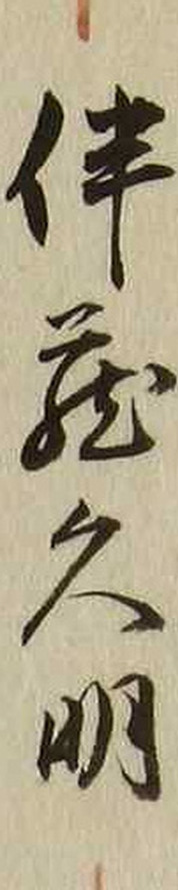伴蔵久明
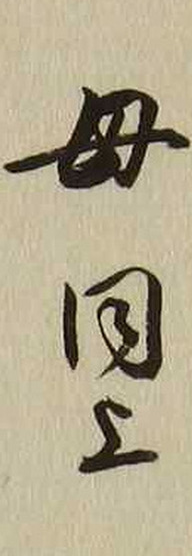母同上
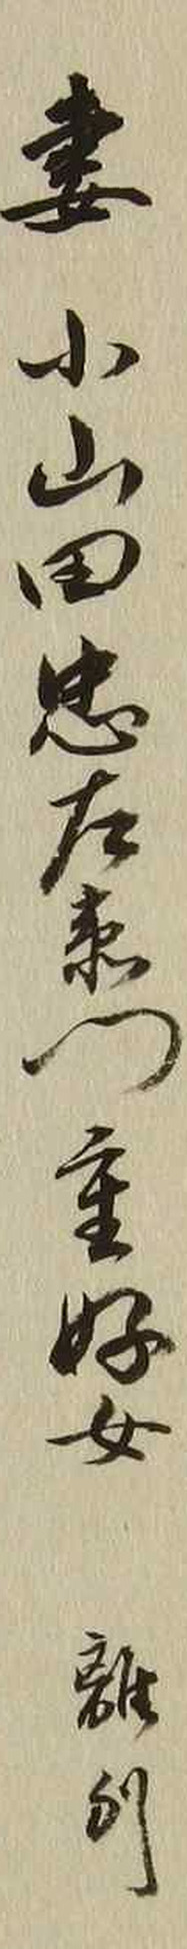妻小山田忠左衛門女離別
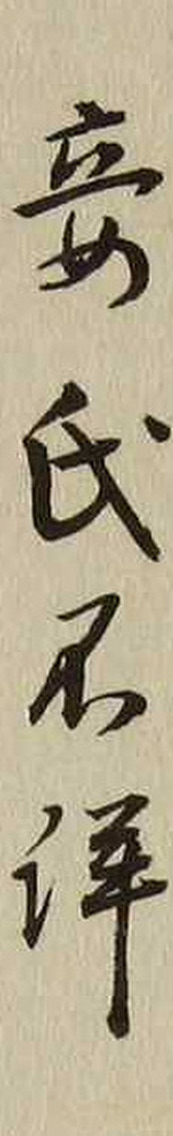妾氏不詳
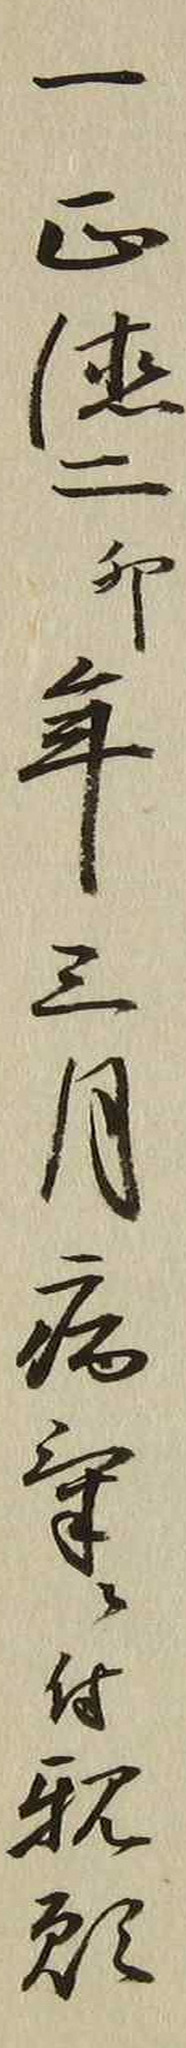一正徳二卯年三月病気ニ付親願
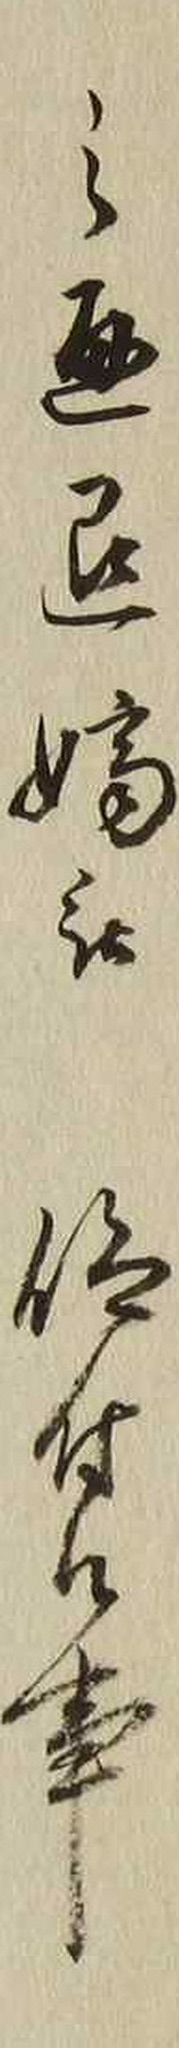之通退嫡被仰付候事
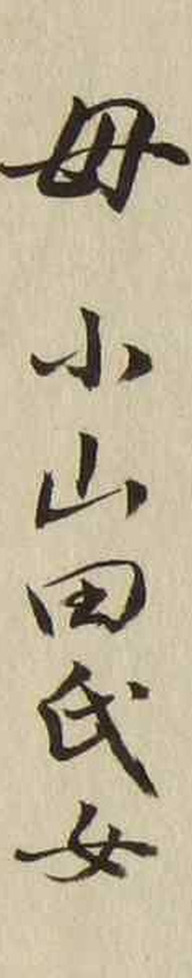母小山田氏女

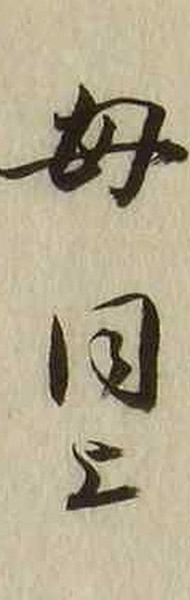母同上
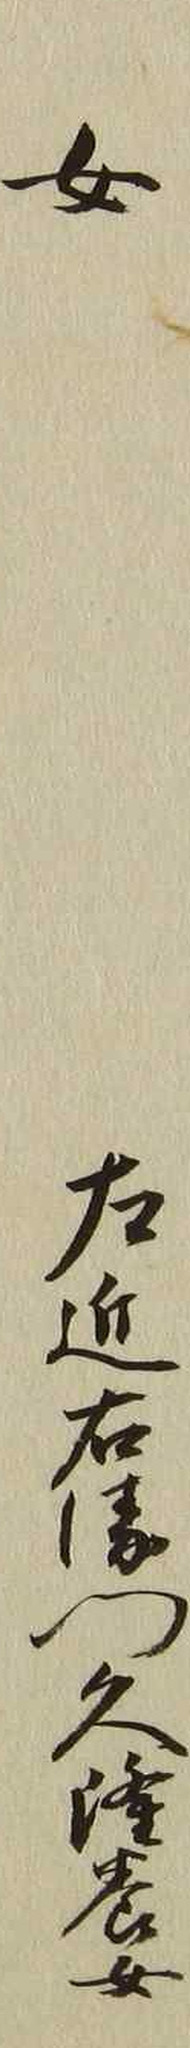女左近右衛門久隆養女
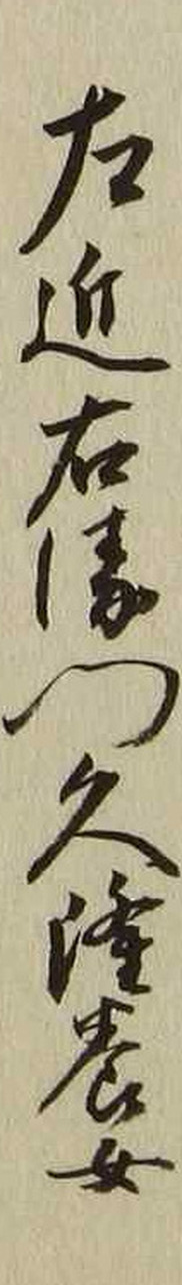女左近右衛門久隆養女
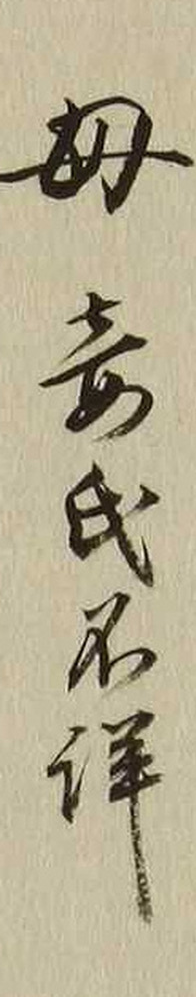母妾氏不詳
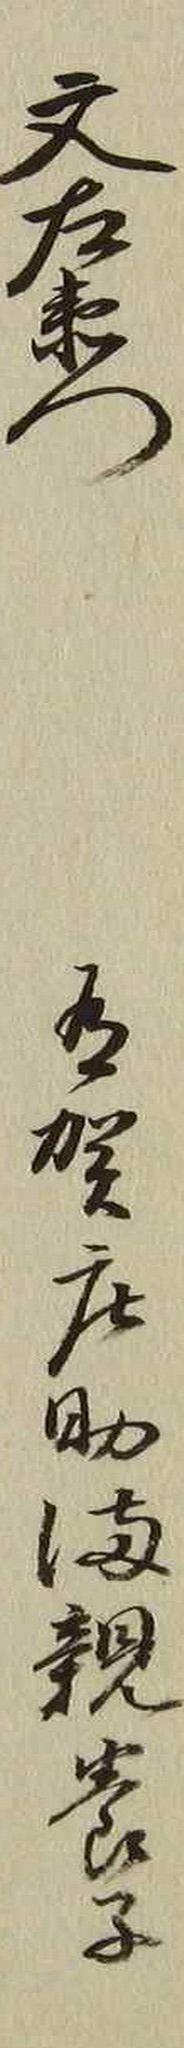文左衛門有賀庄助満親養子
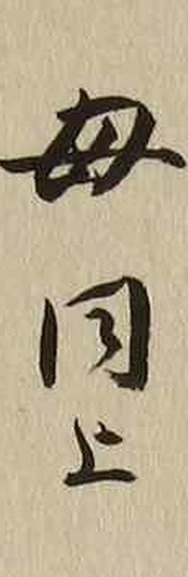母同上
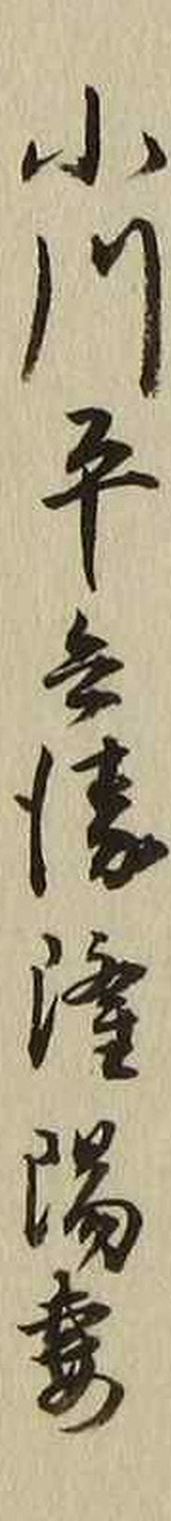小川平兵衛隆陽妻
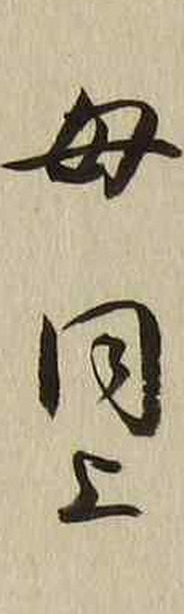母同上
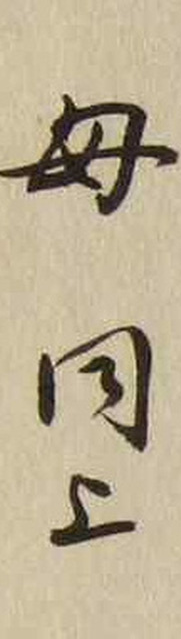母同上
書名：諸士系譜　巻之69　を之部3
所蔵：会津若松市立会津図書館
